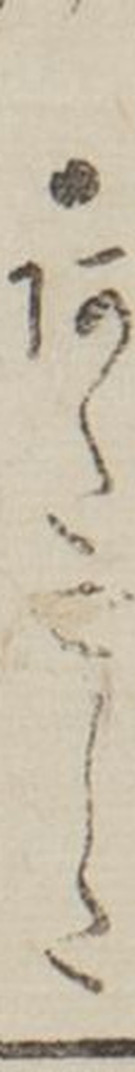●あたごした
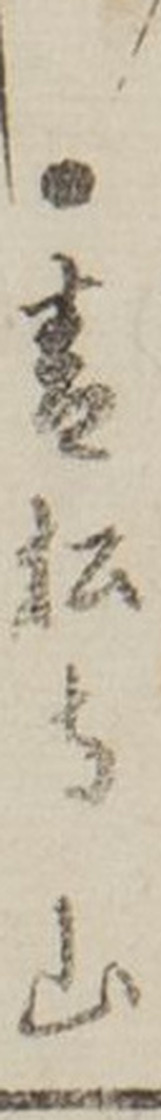●青松寺山
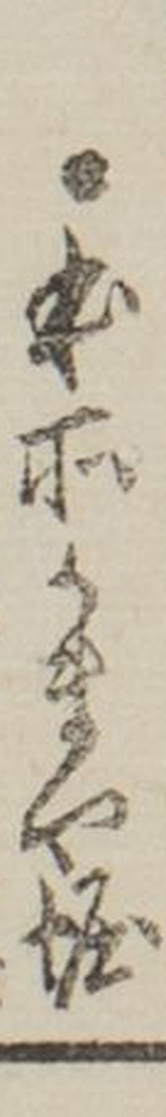●本所うまや堀
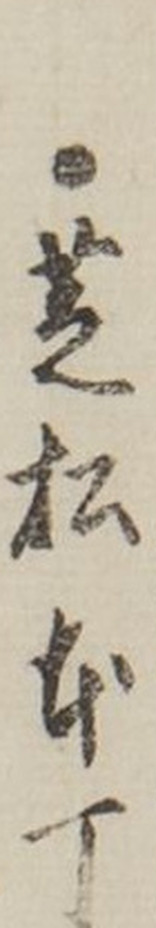●芝松本丁
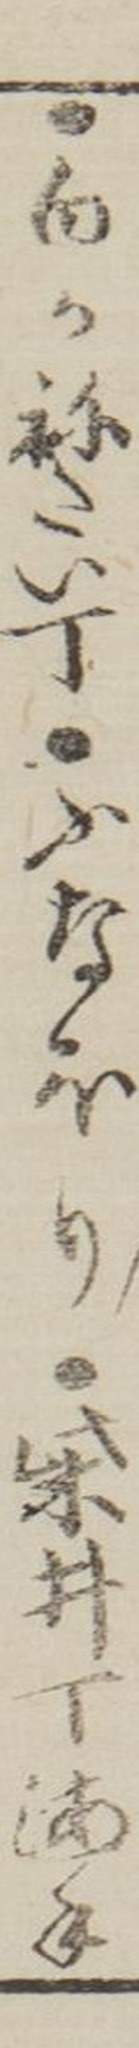●白かねたい丁●ふなほり●柴井丁海手
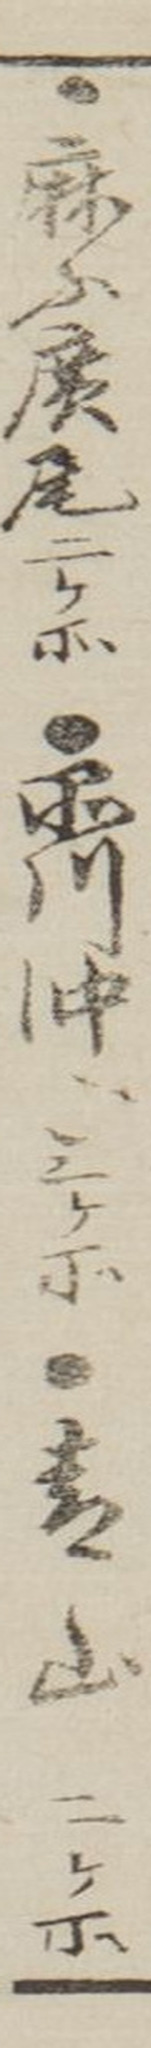●麻ふ広尾二ヶ所●品川沖へ三ヶ所●青山二ヶ所
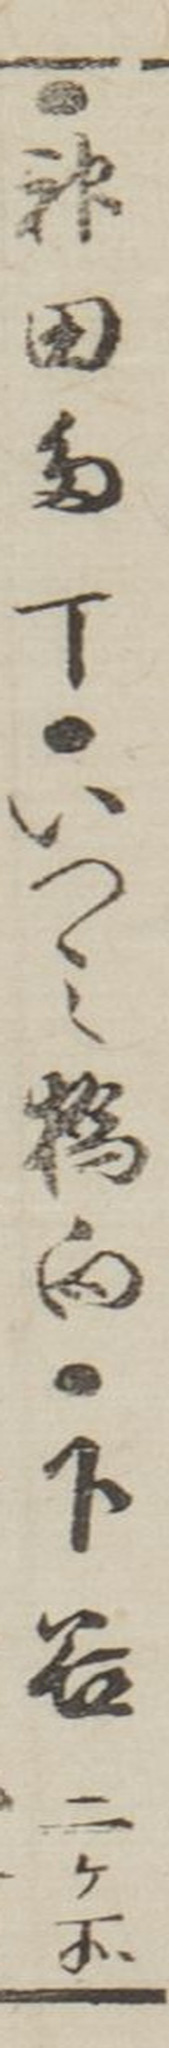●神田多丁●いつみ橋向●下谷二ヶ所
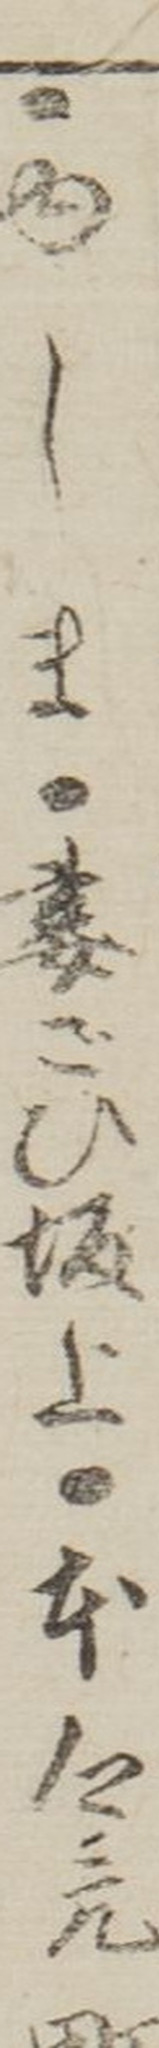●ゆしま●妻ごひ坂上●本郷元町
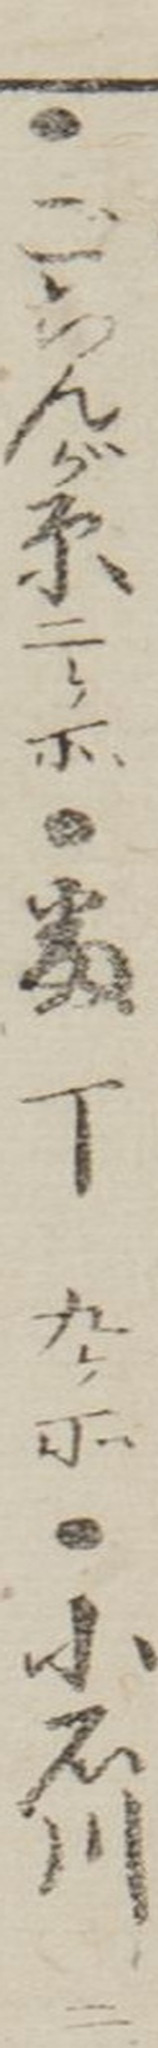●ごちんが原二ヶ所●番丁九ヶ所●小石川二ヶ所
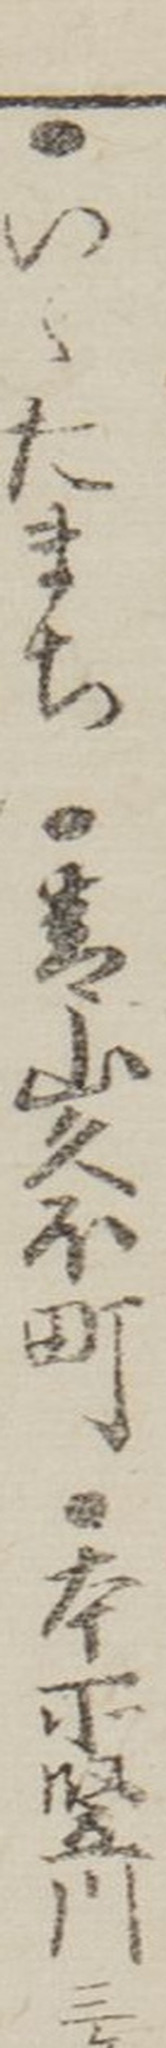●いゝたまち●青山久ほ町●本所竪川三ヶ所
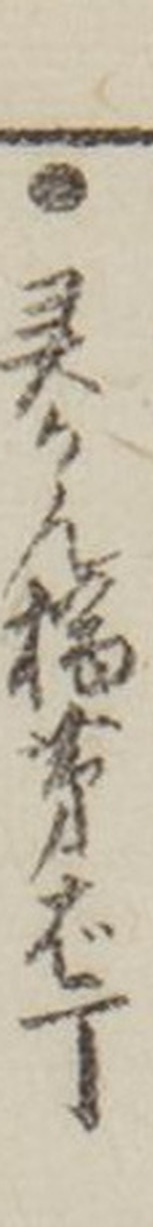●霊かん橋茅ば丁
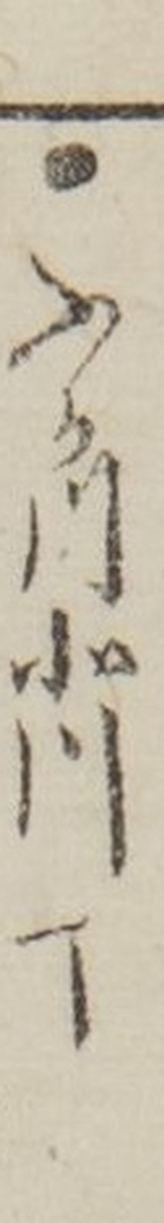●ふか川北川丁
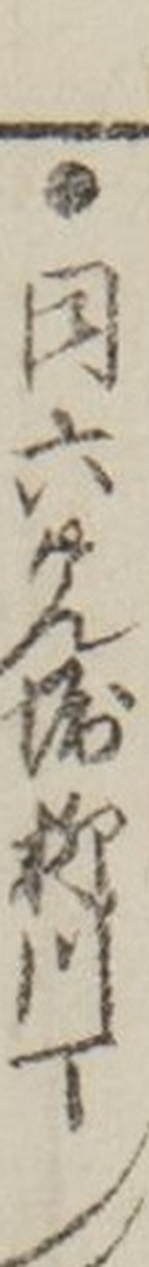●同六けん堀柳川丁
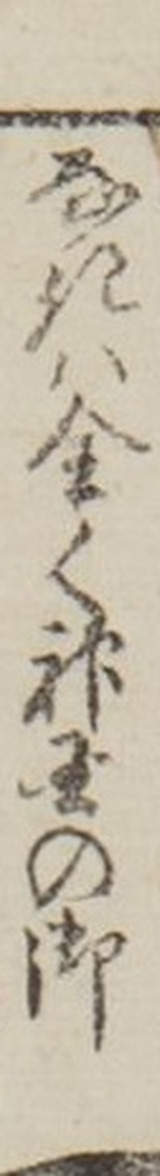なきは全く神国の御
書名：嘉永三年江戸落雷の図
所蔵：あいおいニッセイ同和損保株式会社
